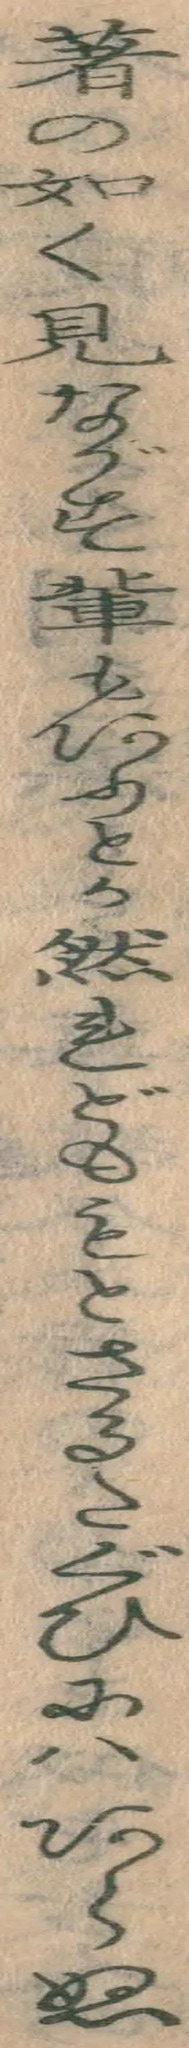著の如く見ながす輩もありとか然れどももとさるたぐひにはあらぬ
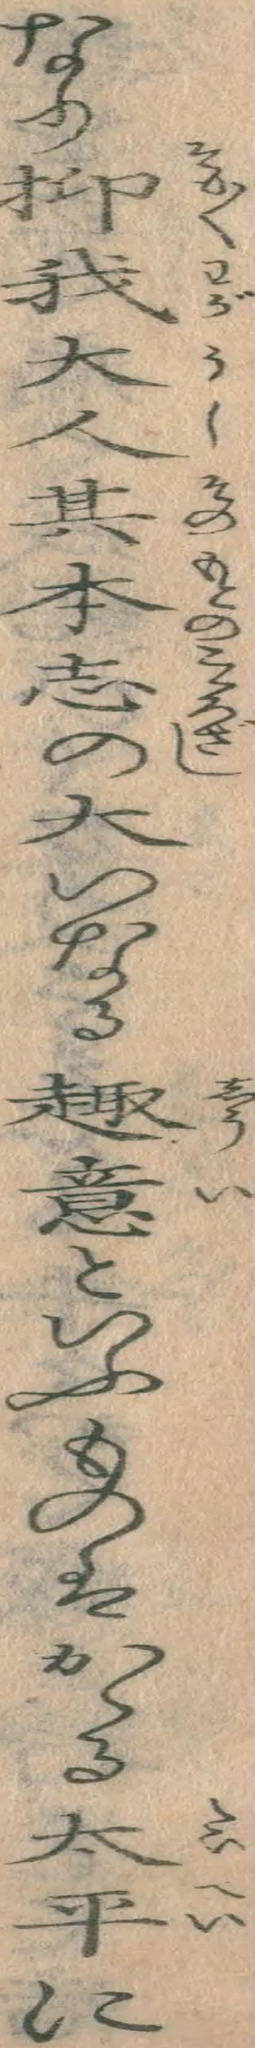なり抑我大人其本志の大いなる趣意といふものはかゝる太平に
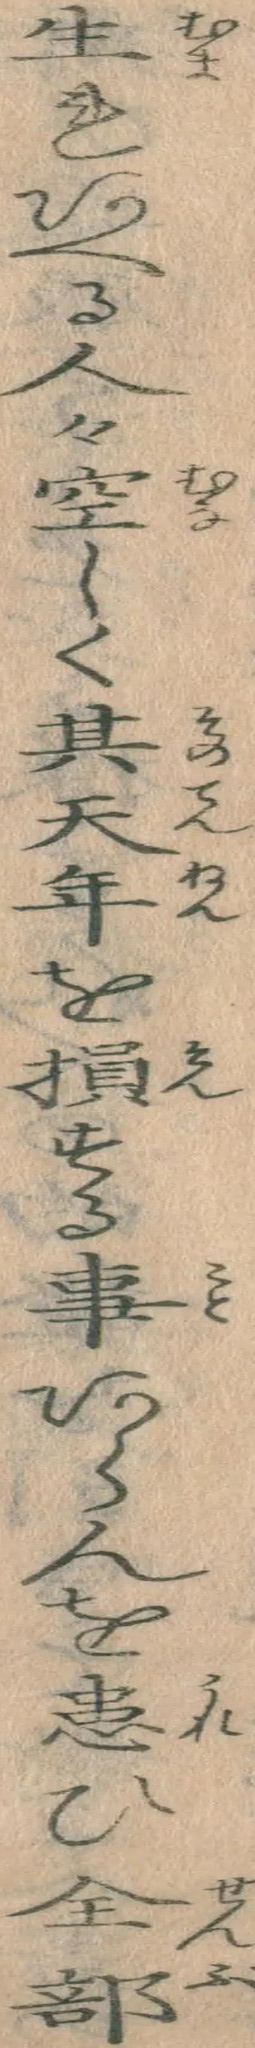生れあへる人々空しく其天年を損する事あらんを患ひ全部
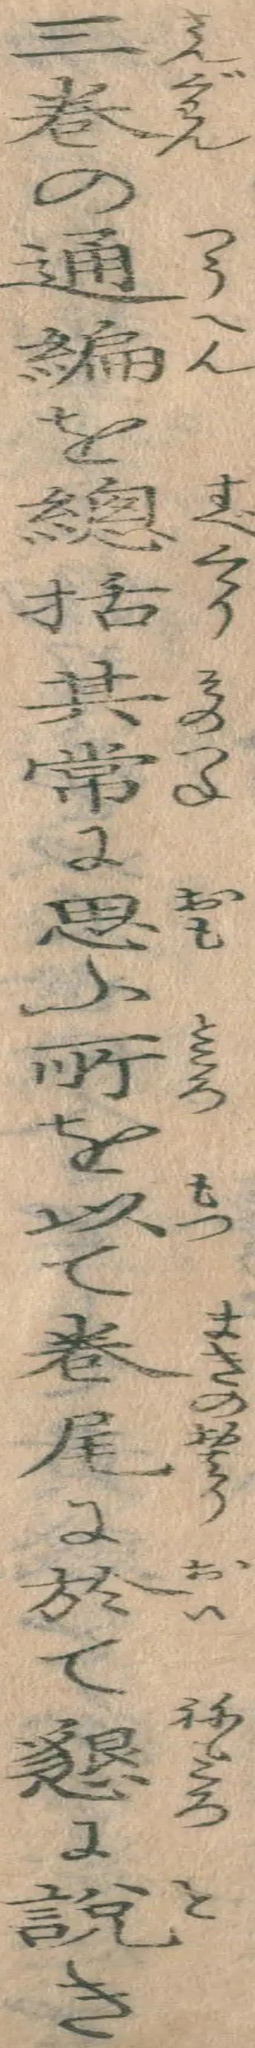三巻の通編を総括其常に思ふ所を以て巻尾に於て懇に説き
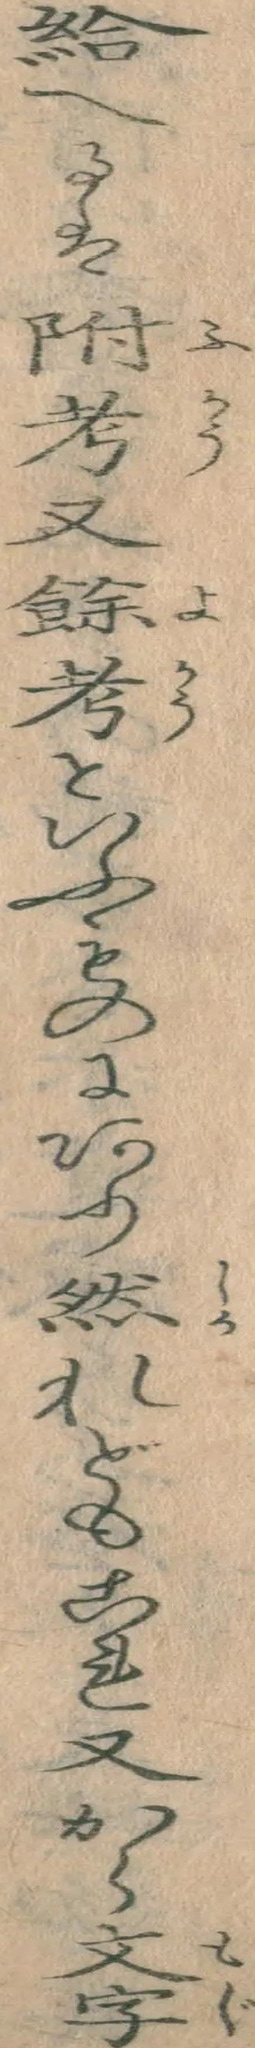給へるは附考又余考といふものにあり然れどもこれ又から文字
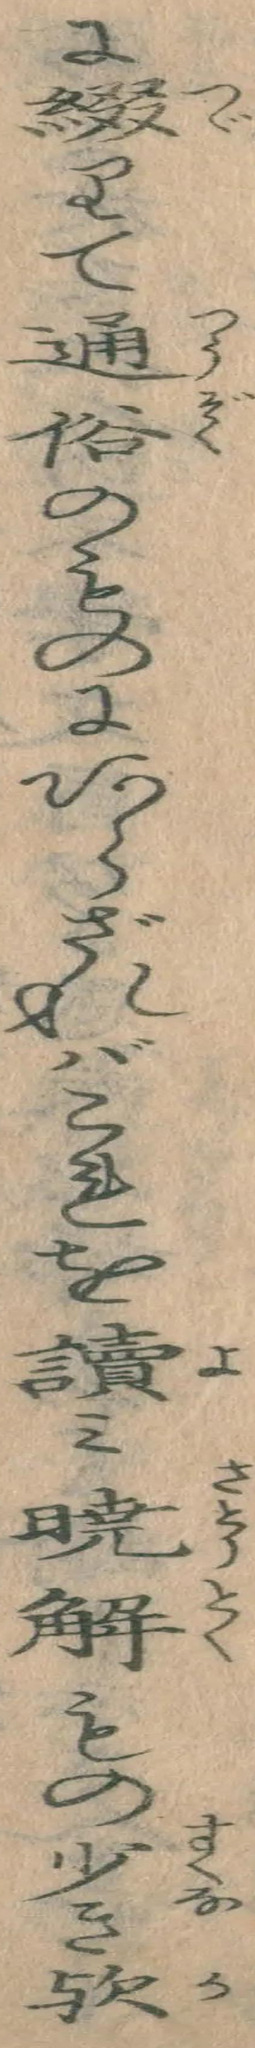に綴りて通俗のものにあらざればこれを読み暁解もの少き歟

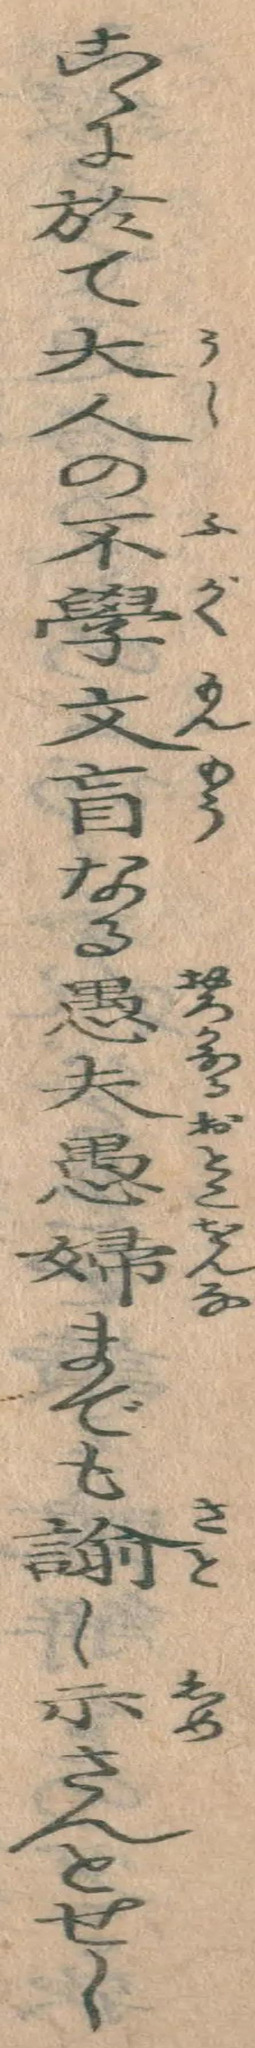こゝに於て大人の不学文盲なる愚夫愚婦までも諭し示さんとせし
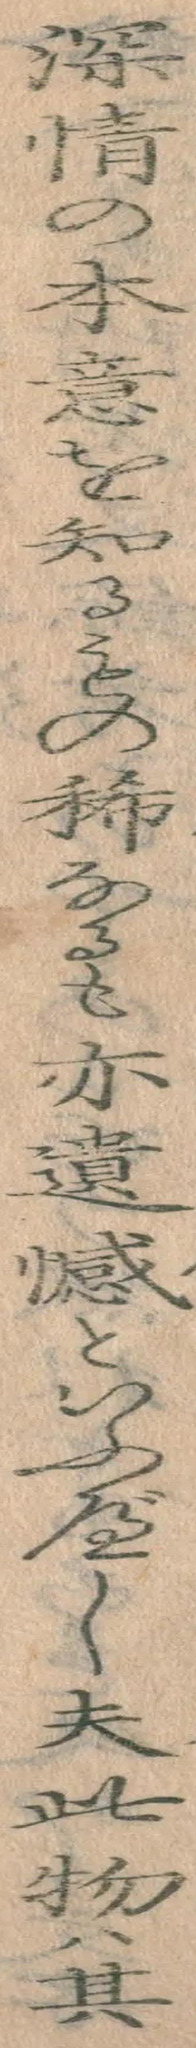深情の本意を知るもの稀なるも亦遺憾といふべし夫此物は其
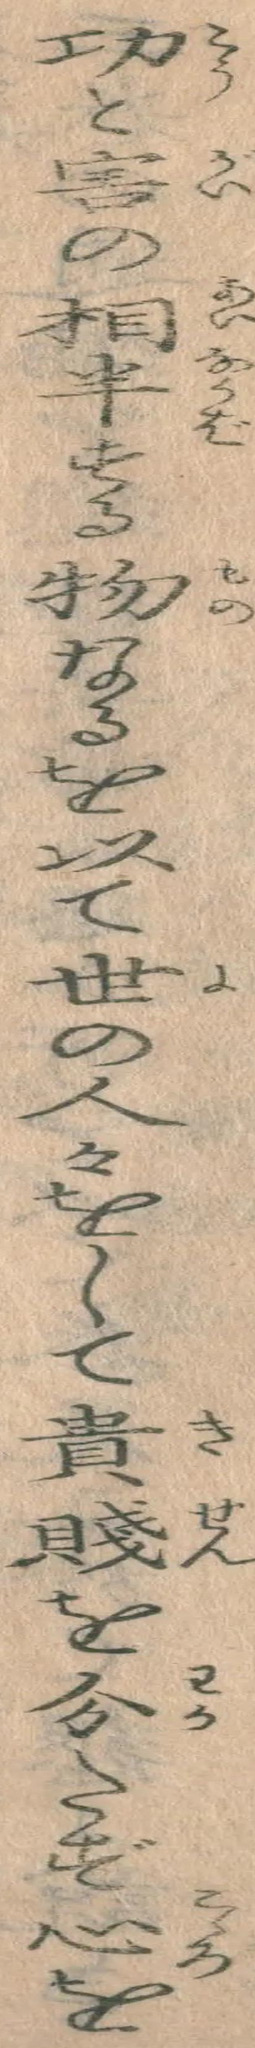功と害の相半する物なるを以て世の人々をして貴賤を分たず心を
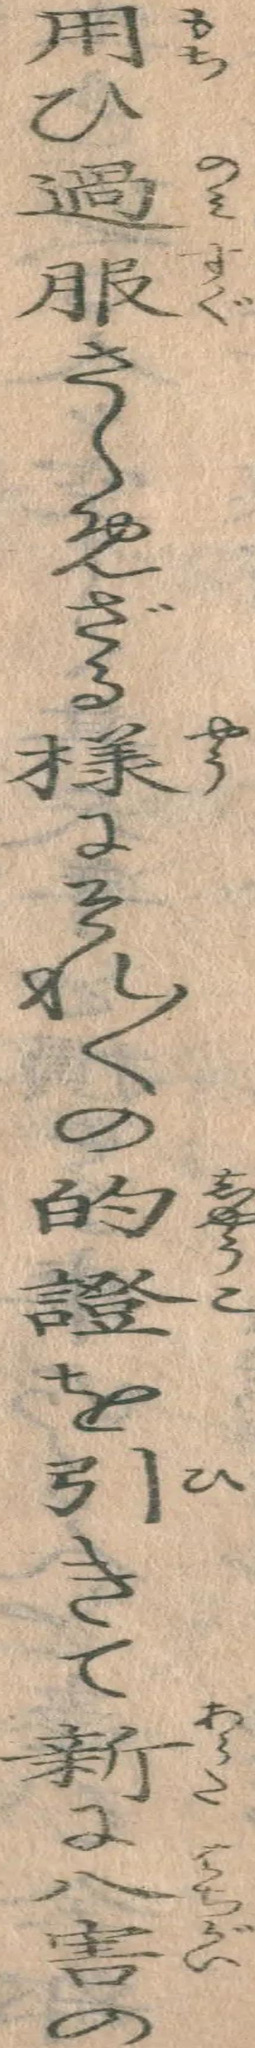用ひ過服さしめざる様にそれ〳〵の的証を引きて新に八害の
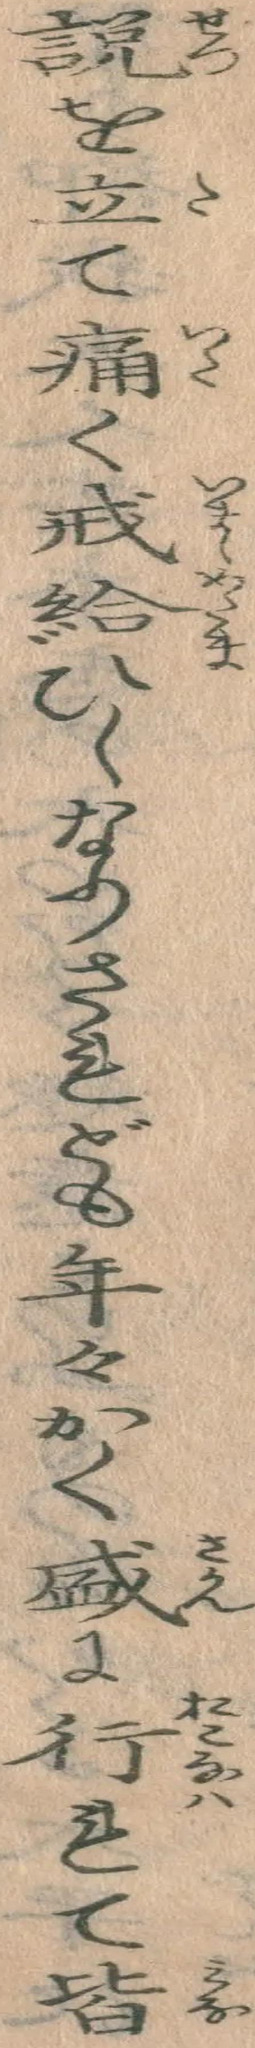説を立て痛く戒給ひしなりされども年々かく盛に行れて皆
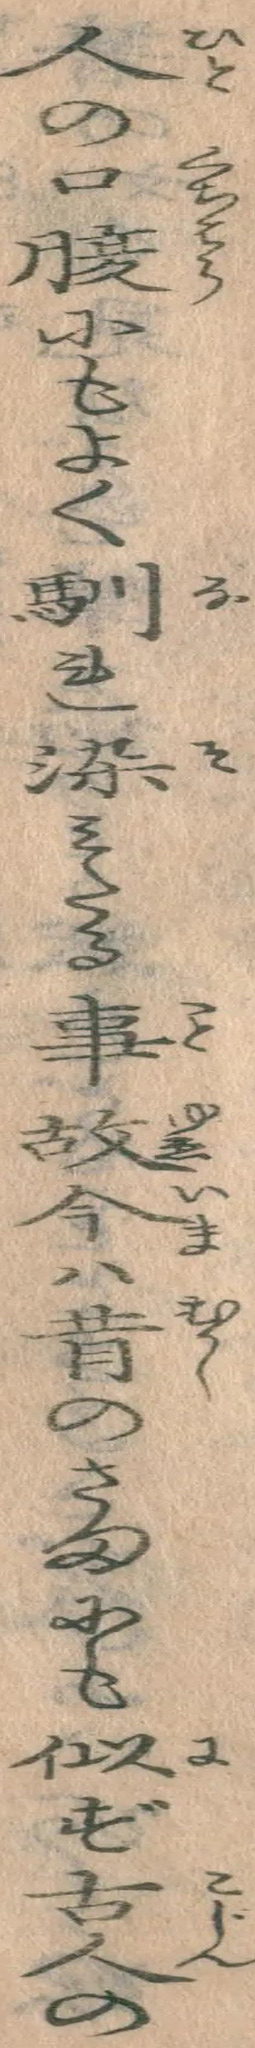人の口腹にもよく馴れ染みたる事故今は昔のさまにも似ず古人の
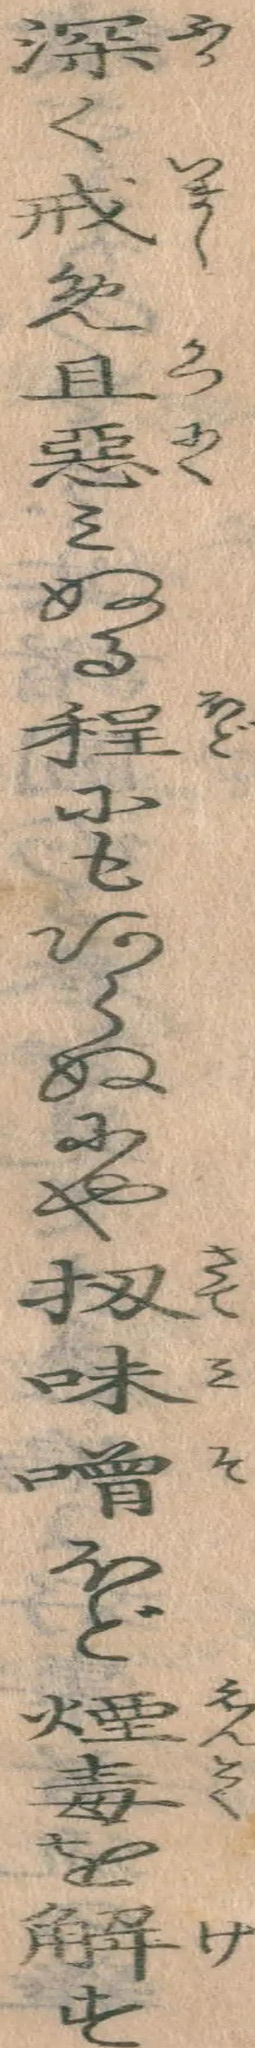深く戒め且悪みぬる程にもあらぬにや扨味噌ほど煙毒を解す
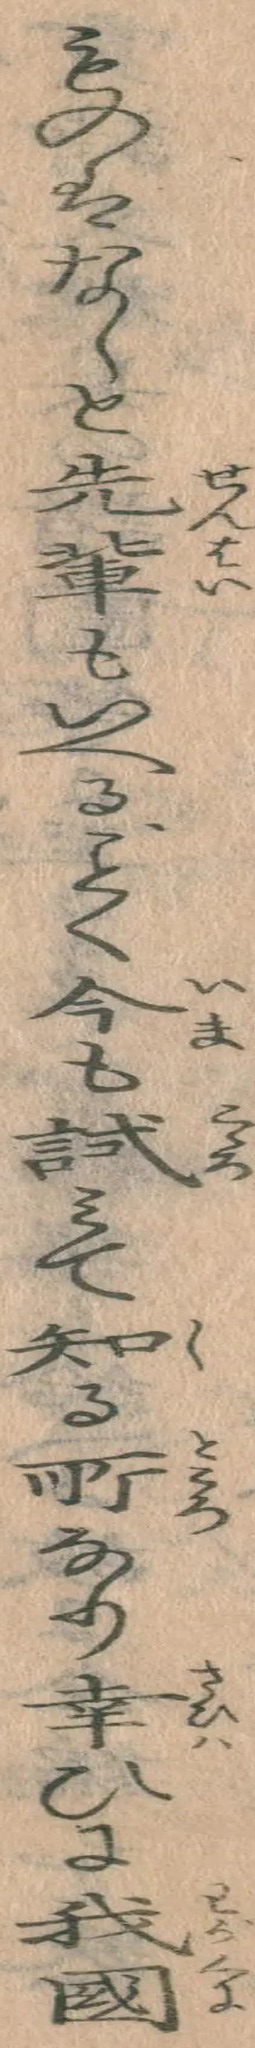ものはなしと先輩もいへるごとく今も試みて知る所なり幸ひに我国
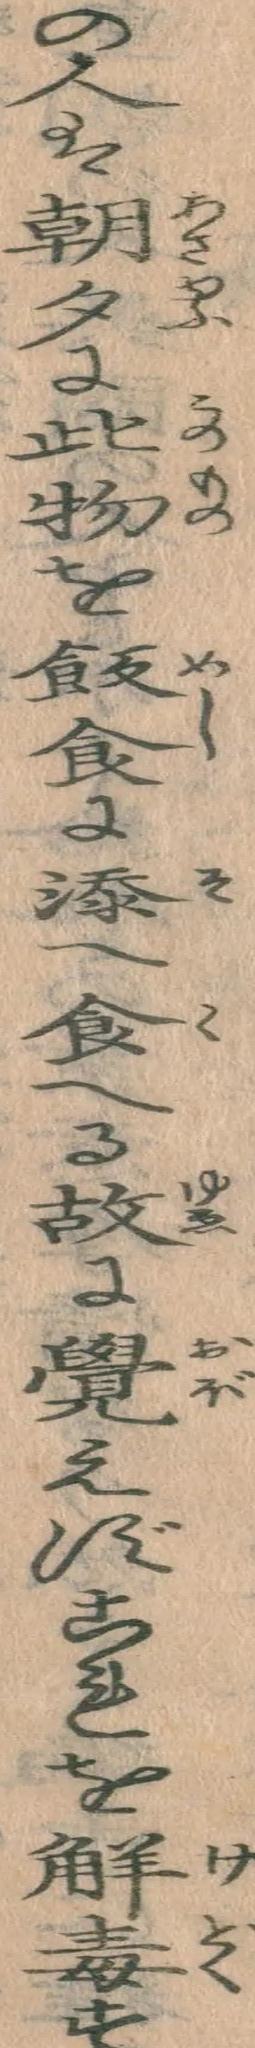の人は朝夕に此物を飯食に添へ食へる故に覚えずこれを解毒す
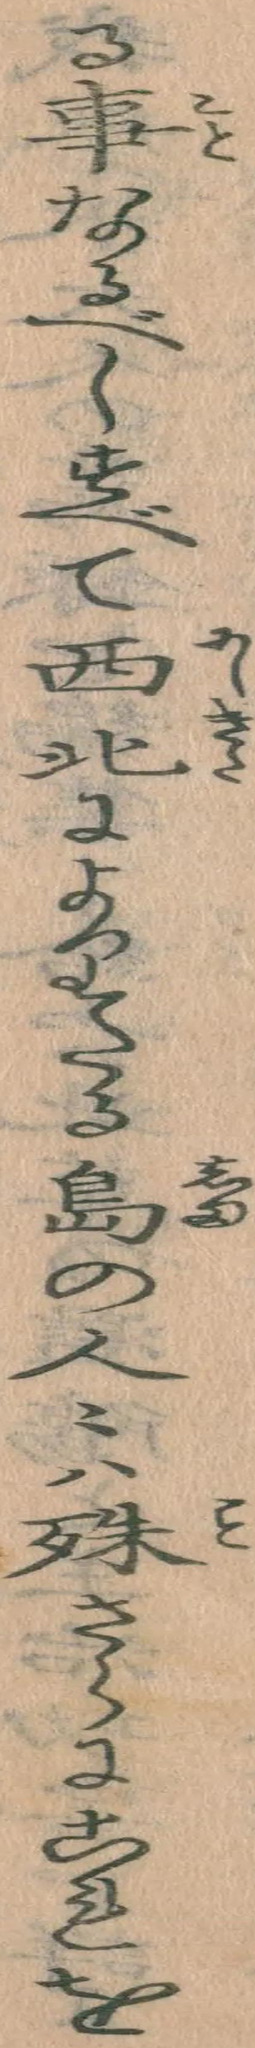る事なるべしすべて西北によりたる島の人々は殊さらにこれを
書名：目さまし草
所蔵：国立国会図書館 National Diet Library, JAPAN
